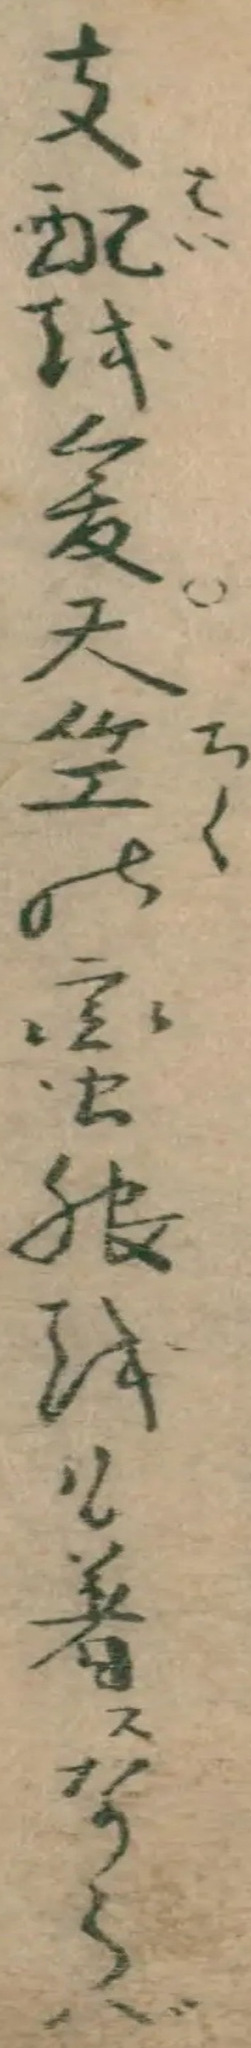支配を爰。天竺の蛮服をも着すならば

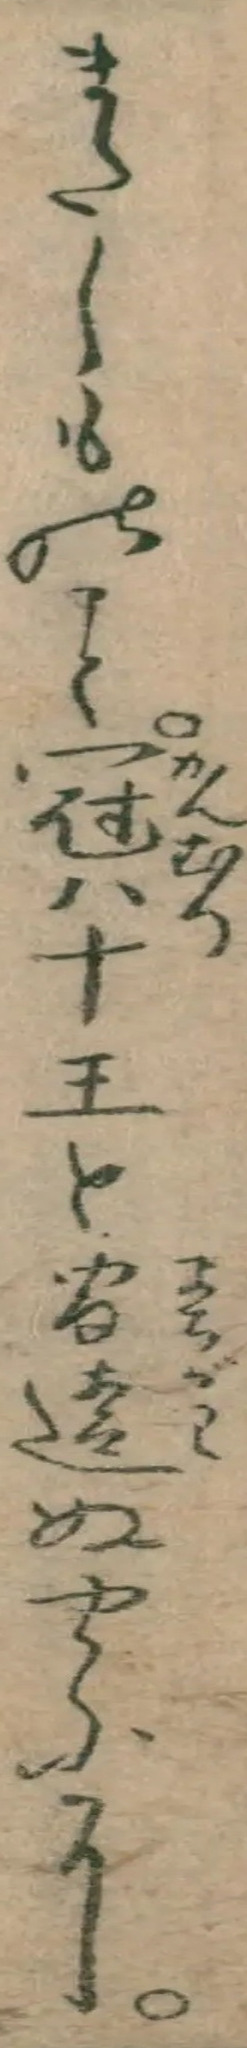またしものこと。冠は十王と間違ぬやふに。
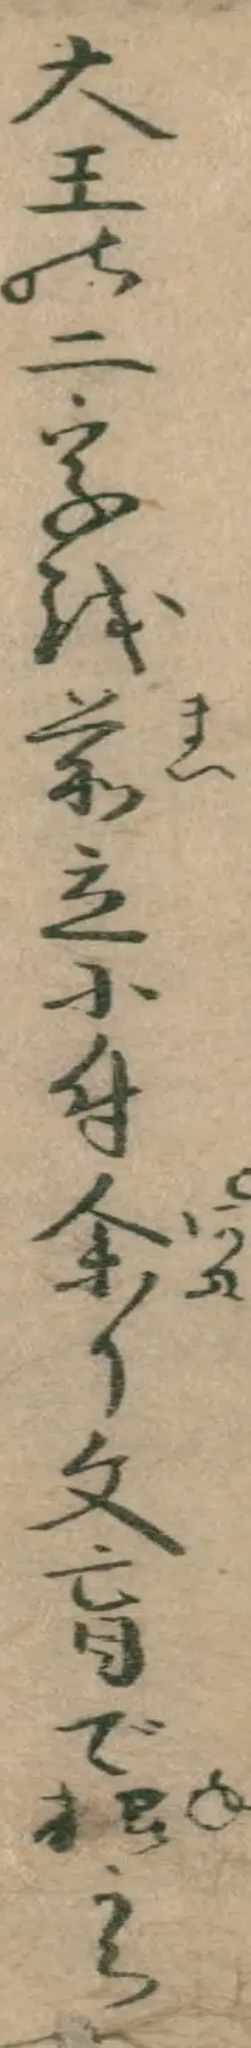大王の二字を前立に付。余り文盲で根から
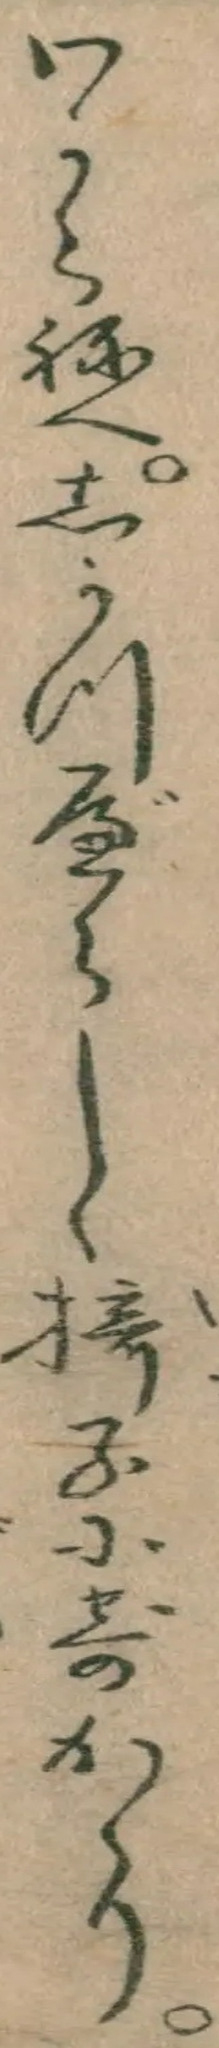わからねへ。しかつべらしく椅子に寄かゝり。
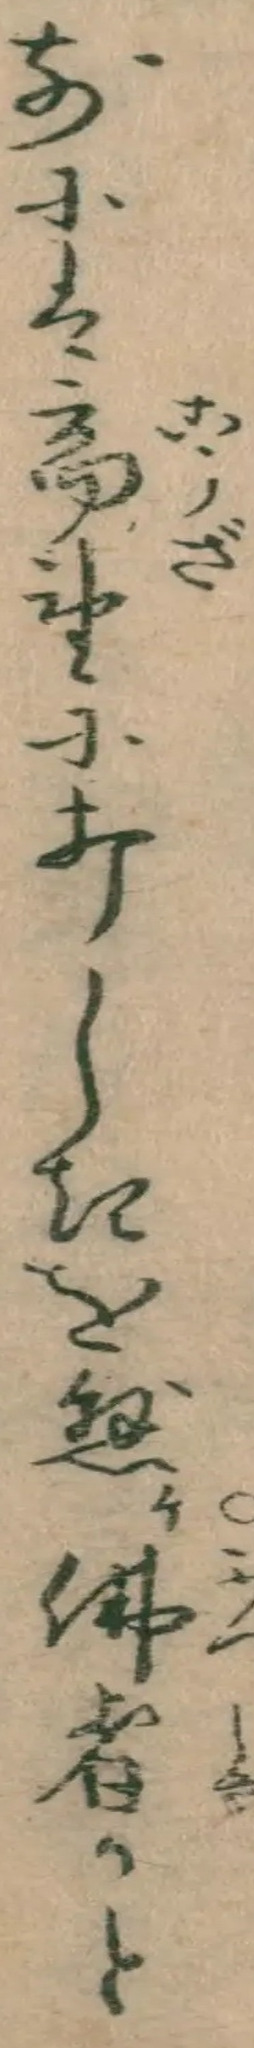前には高坐に打しきを懸。仏者かと
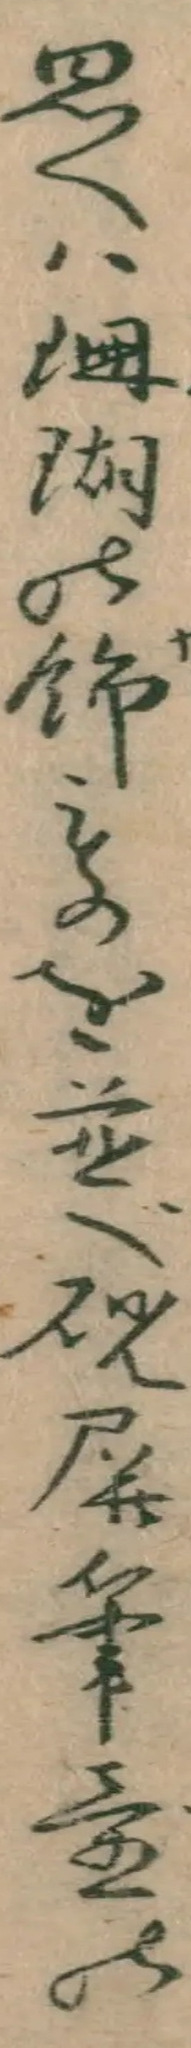思へは珊瑚の飾ものを並べ。硯屏筆壺の
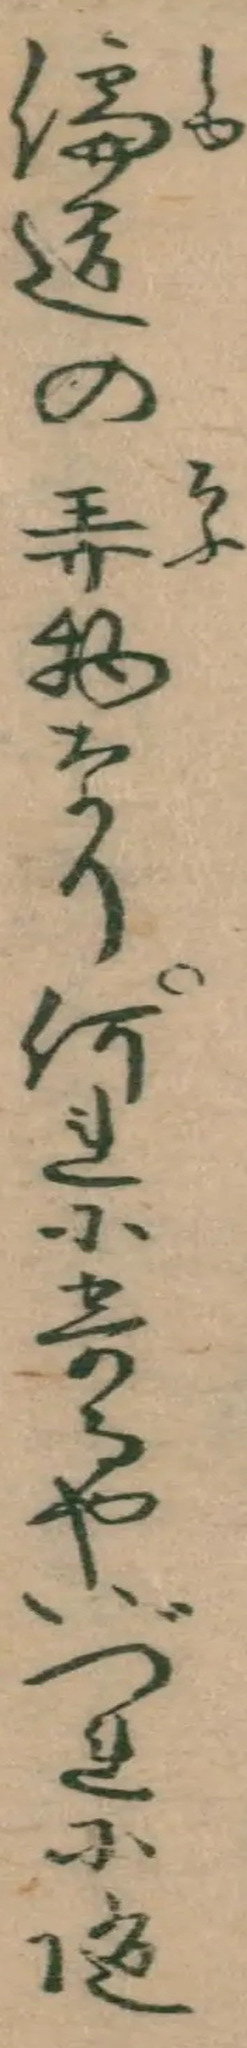儒道の弄物なり。何れに寄る也いづれに随
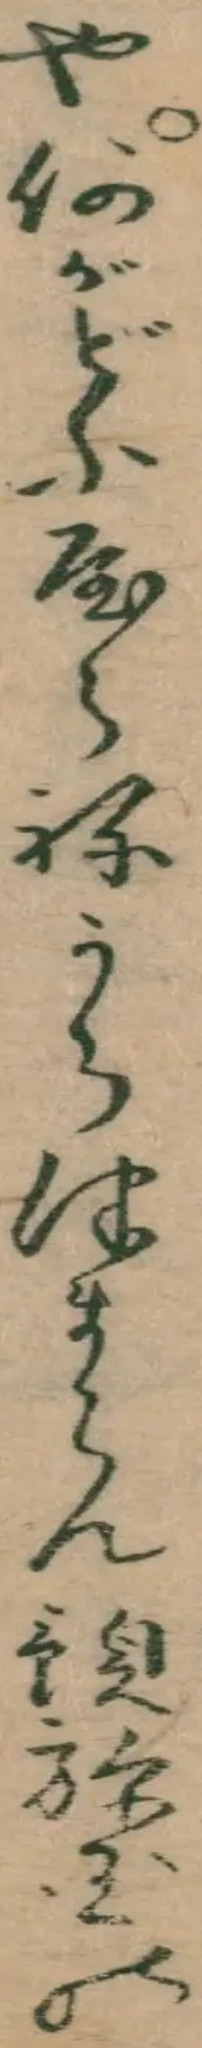也。何がどふやらねからつまらん。預弥国の
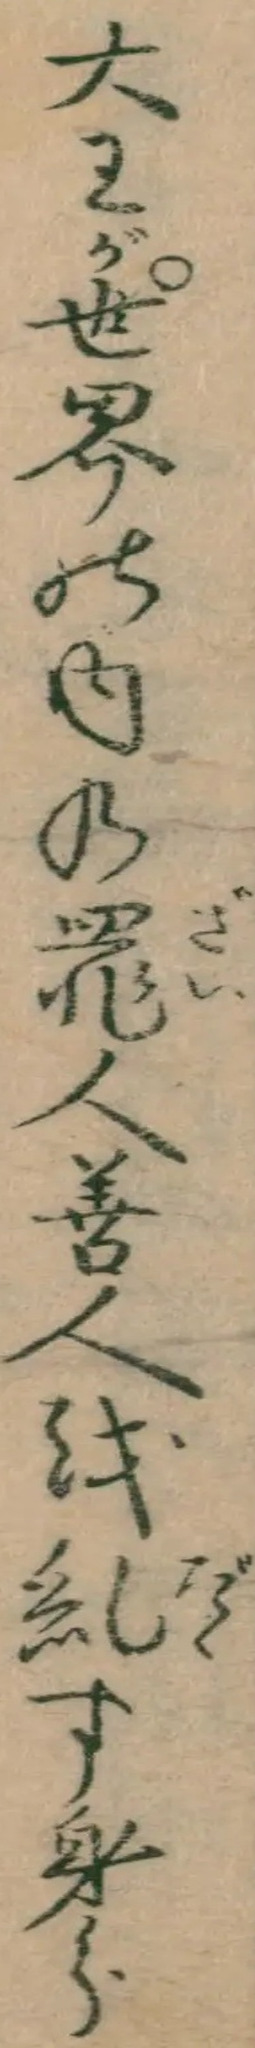大王が。世界の内の罪人善人を糺す身分
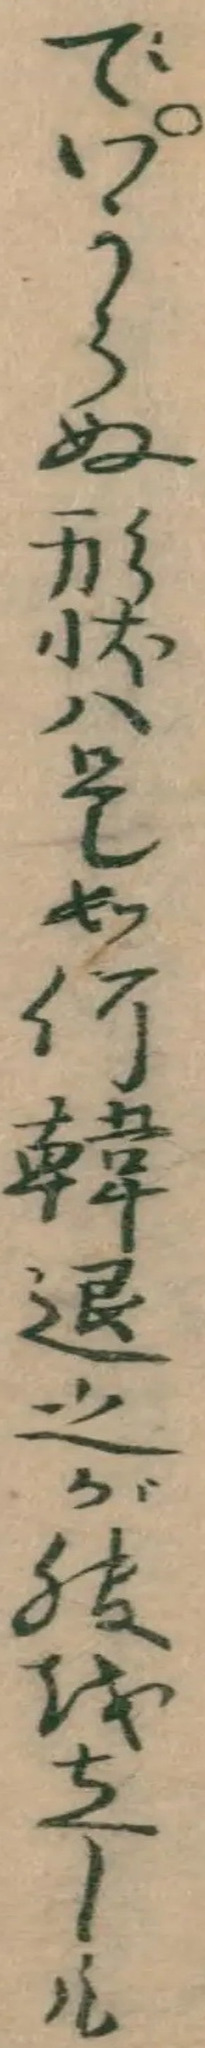で。わからぬ形状は是如何。韓退之が服を支しも
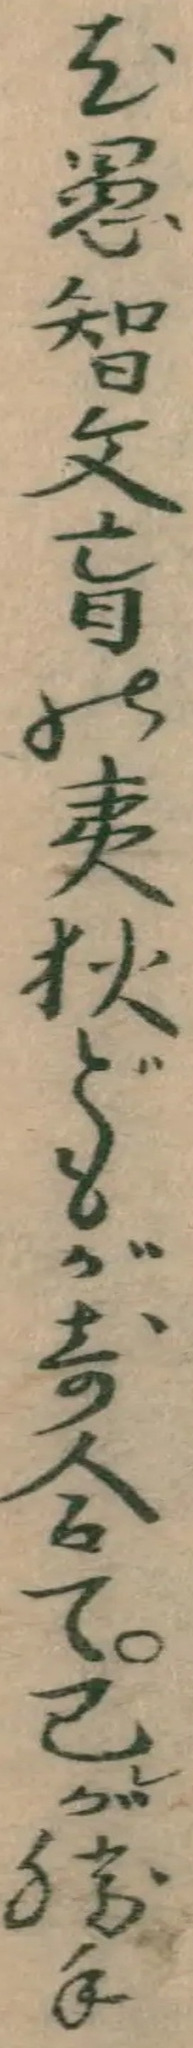尤愚智文盲の夷狄どもが寄合て。己が勝手
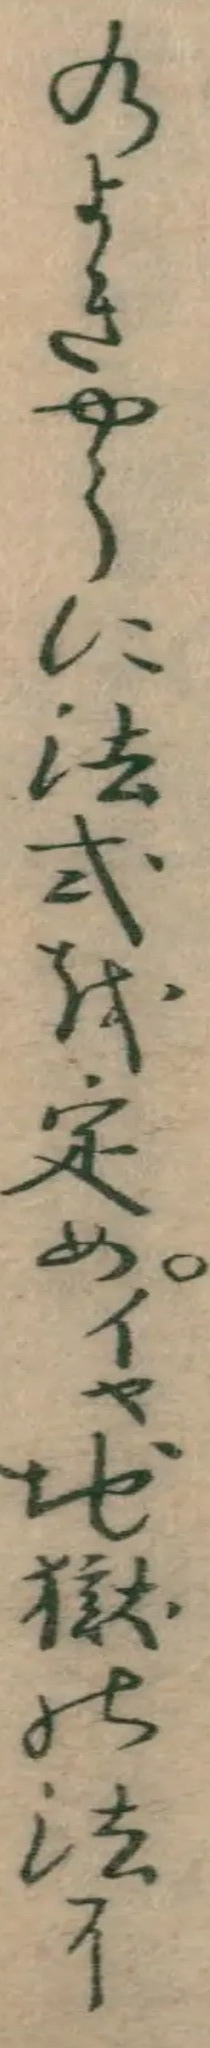のよきやうに法式を定め。イヤ地獄の法に
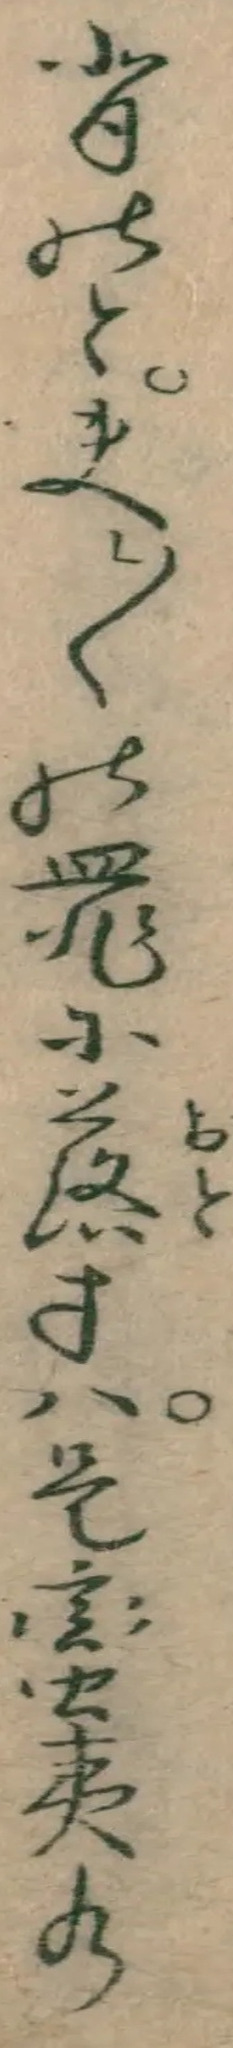背のと。夫〳〵の罪に落すは。是蛮夷の
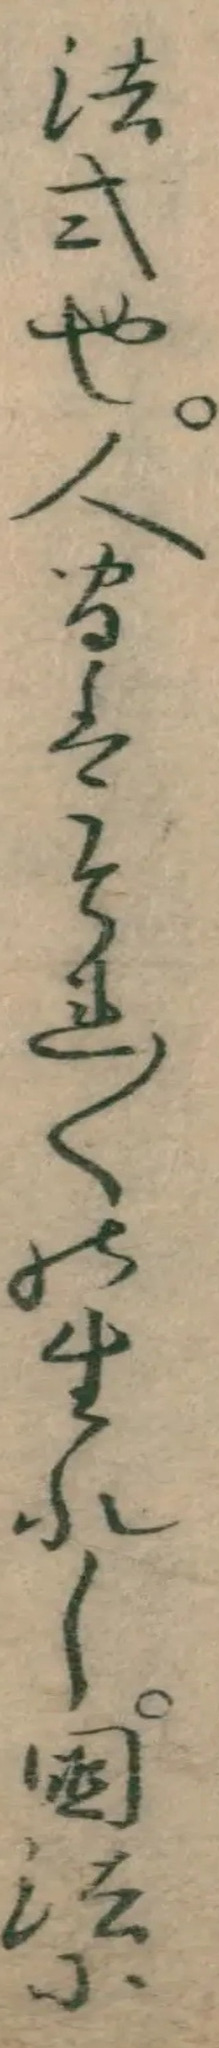法式也。人間はそれ〳〵の生れし。国法に
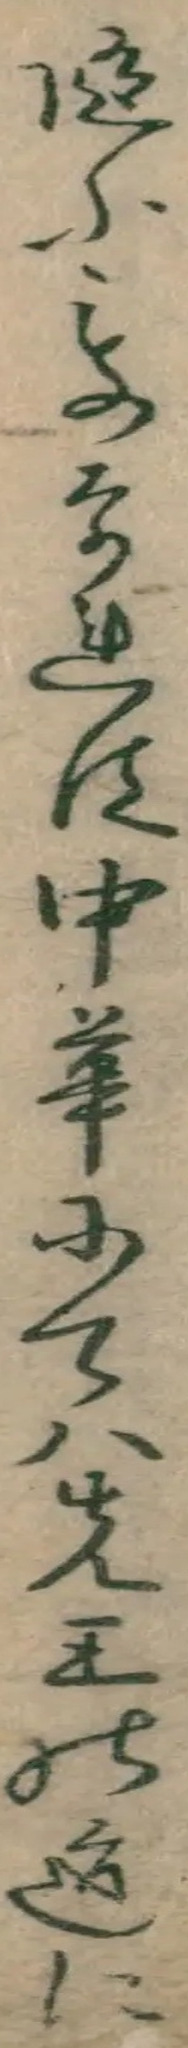随ふものなれは。中華にては先王の道に
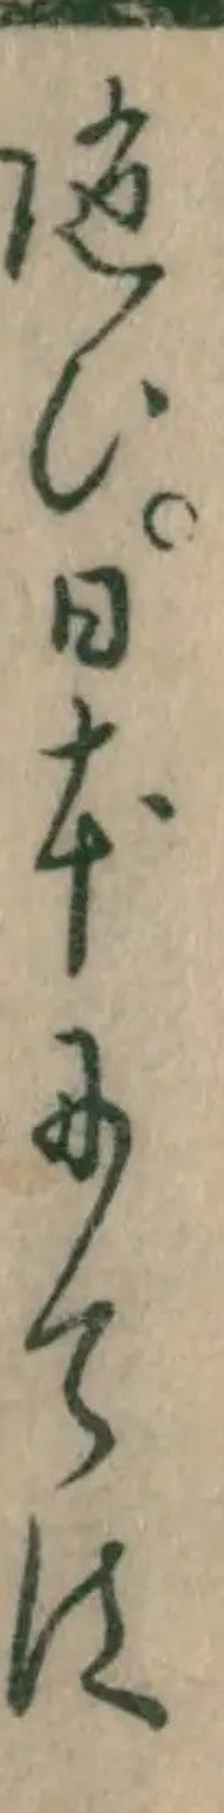随ひ。日本にては
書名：翻草盲目
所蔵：国立国会図書館 National Diet Library, JAPAN
